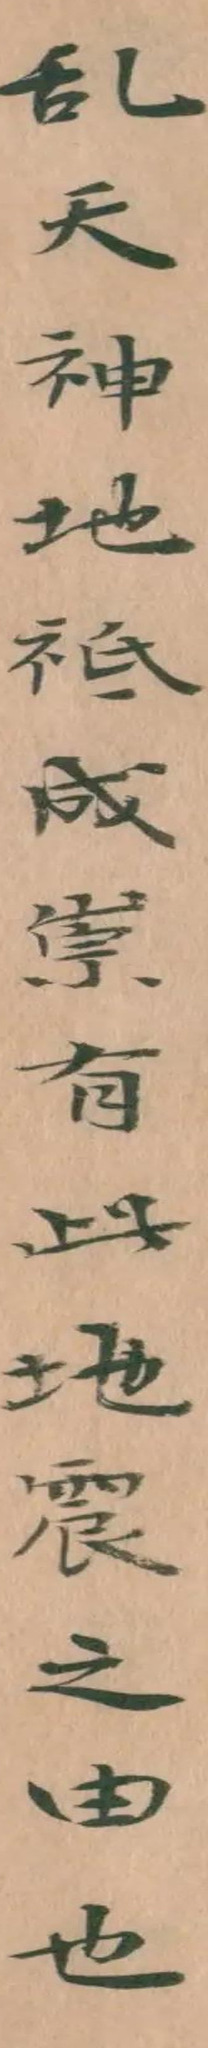乱天神地祗成祟有此地震之由也
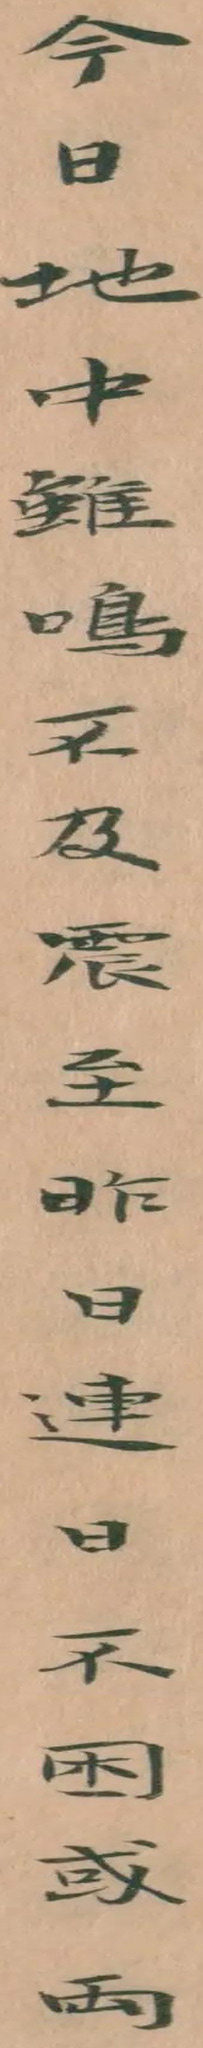今日地中雖鳴不及震至昨日連日不困或両
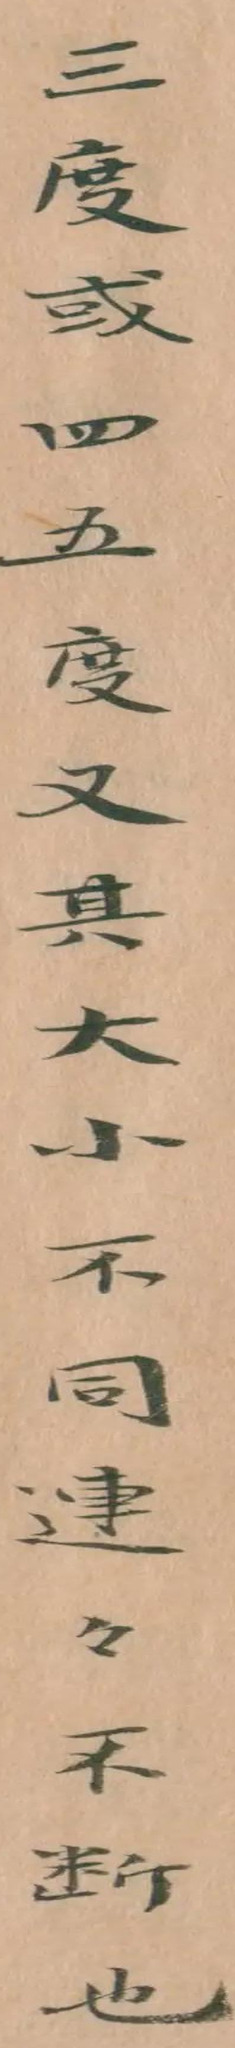三度或四五度又其大小不同連々不断也

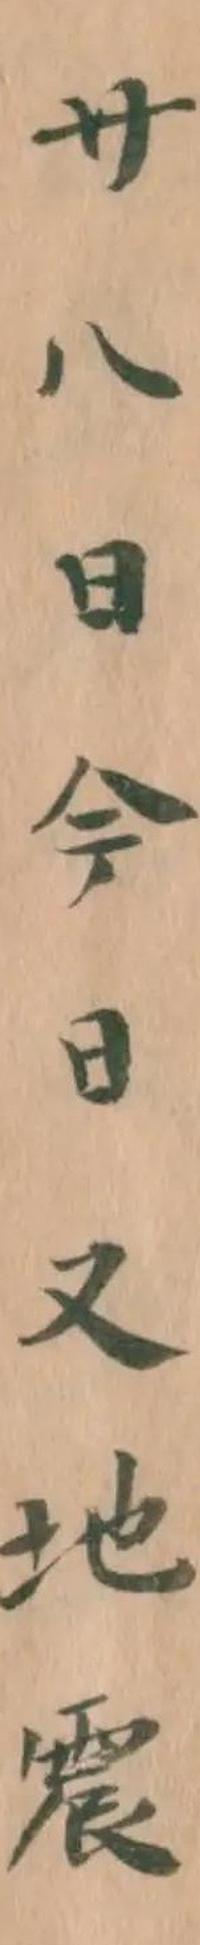廿八日今日又地震
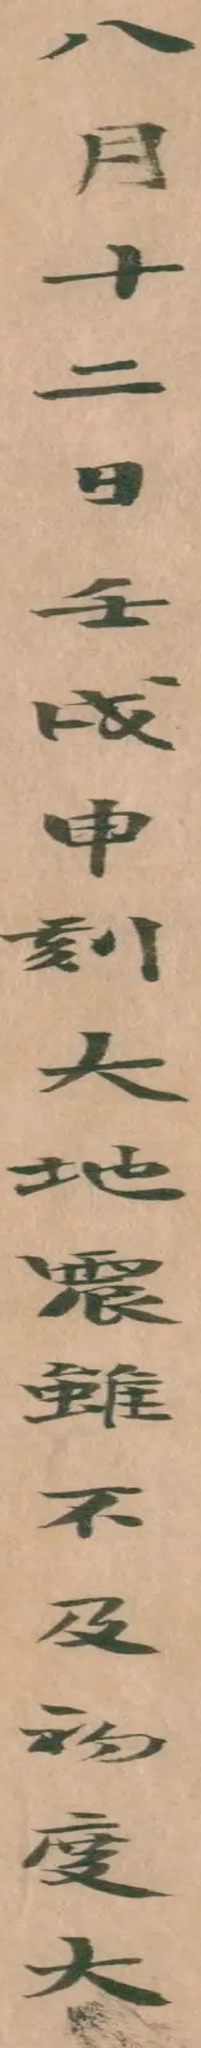八月十二日壬戌申刻大地震雖不及初度大
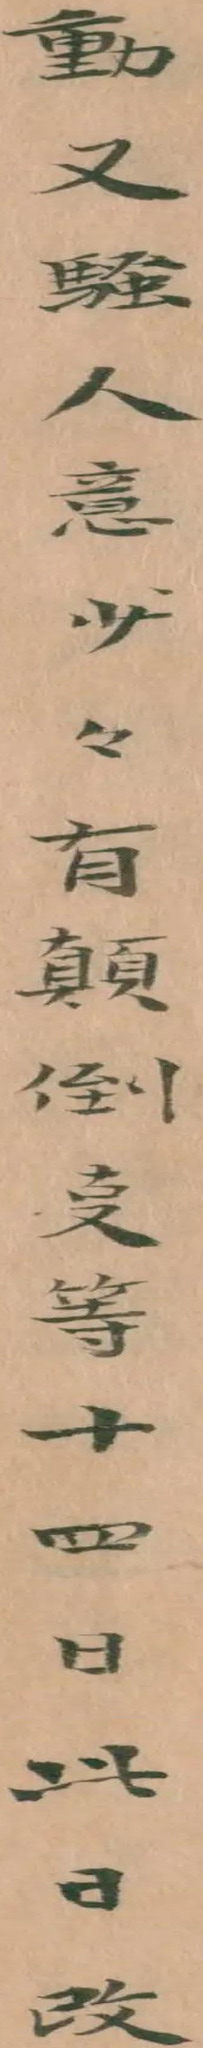動又騒人意少々有顛倒事等十四日此日改
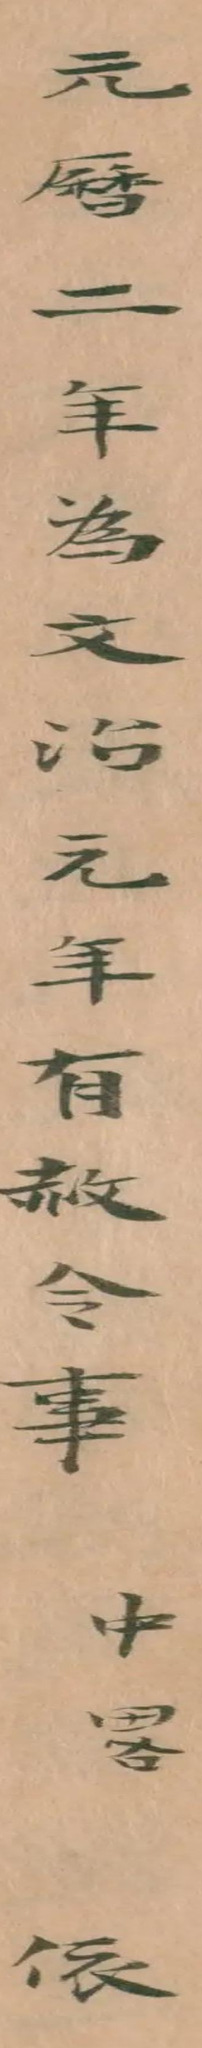元暦二年為文治元年有赦令事中略依
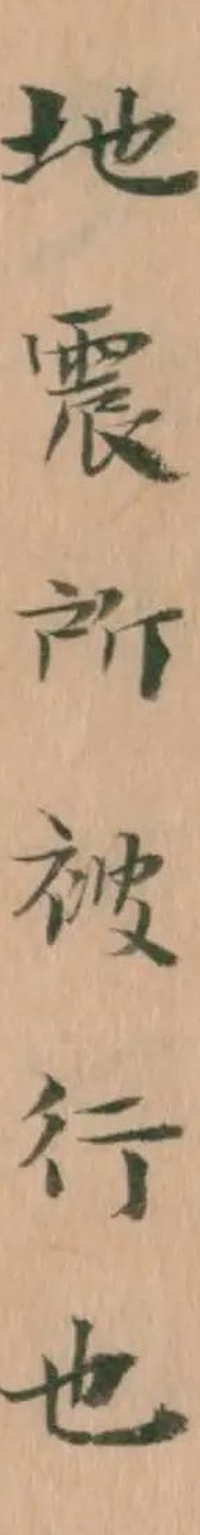地震所被行也
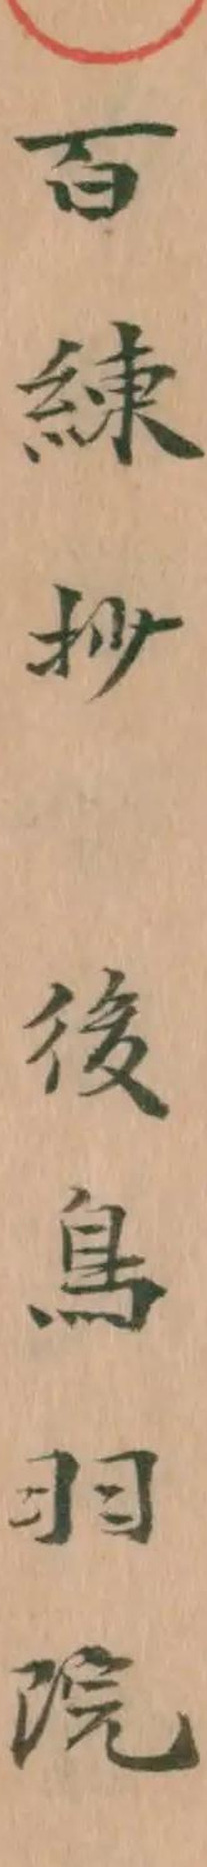○百練抄後鳥羽院
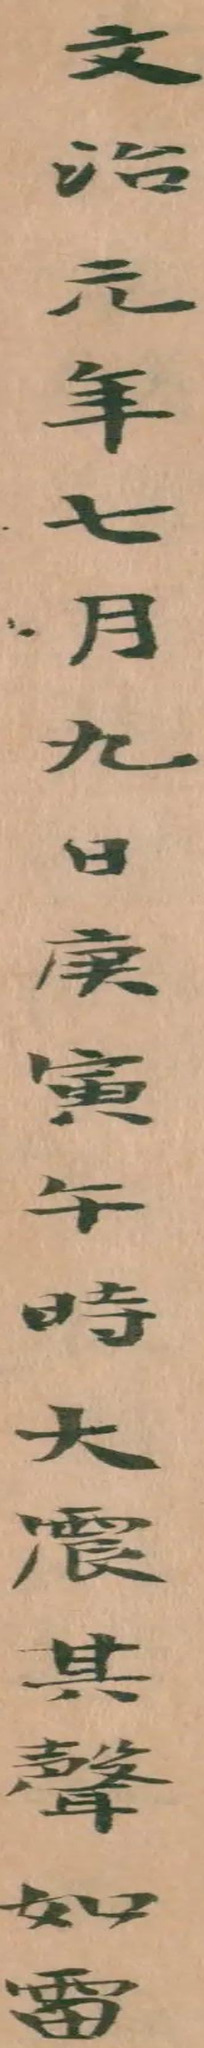文治元年七月九日庚寅午時大震其声如雷
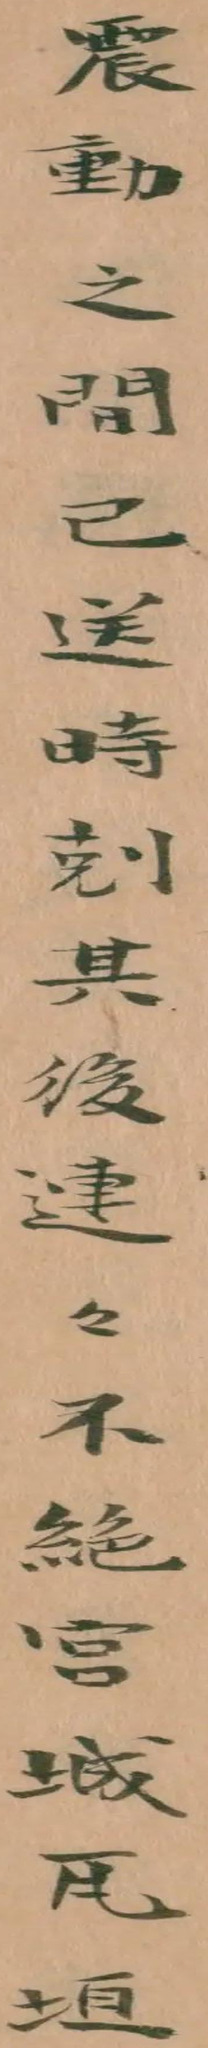震動之間已送時剋其後連々不絶宮城瓦垣
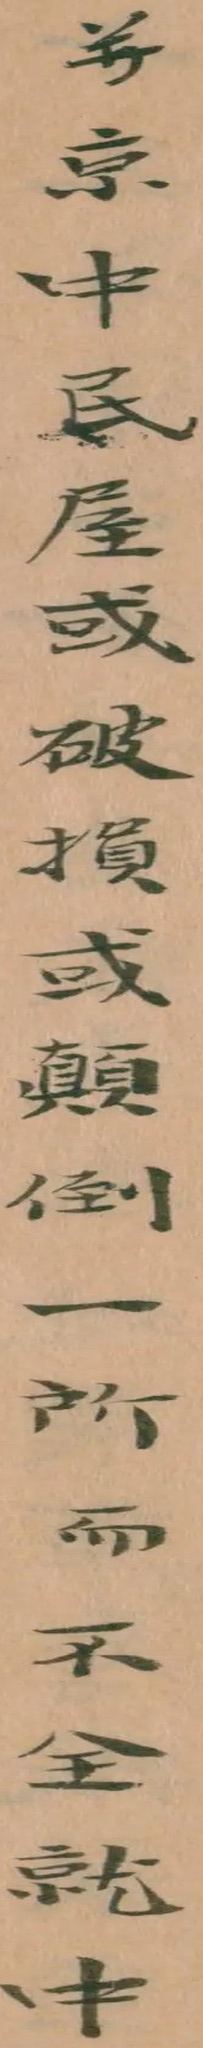幷京中民屋或破損或顛倒一所而不全就中
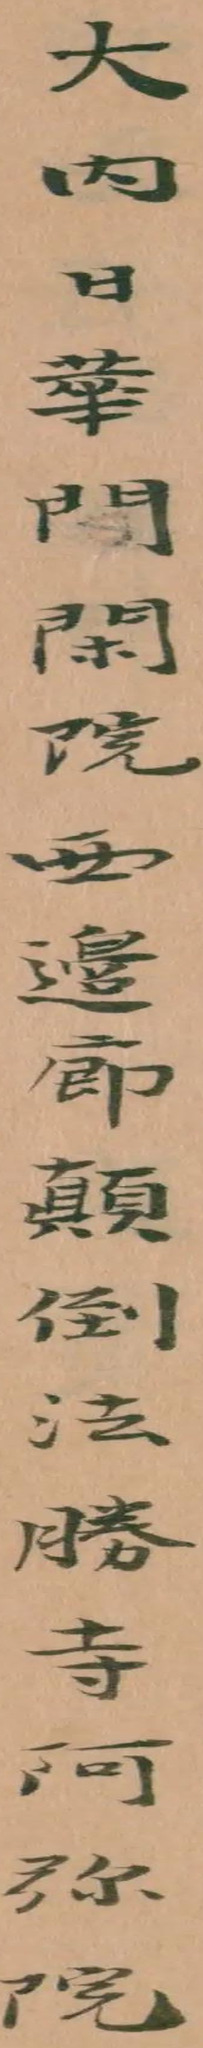大内日華門閑院西辺廊顛倒法勝寺阿弥陀
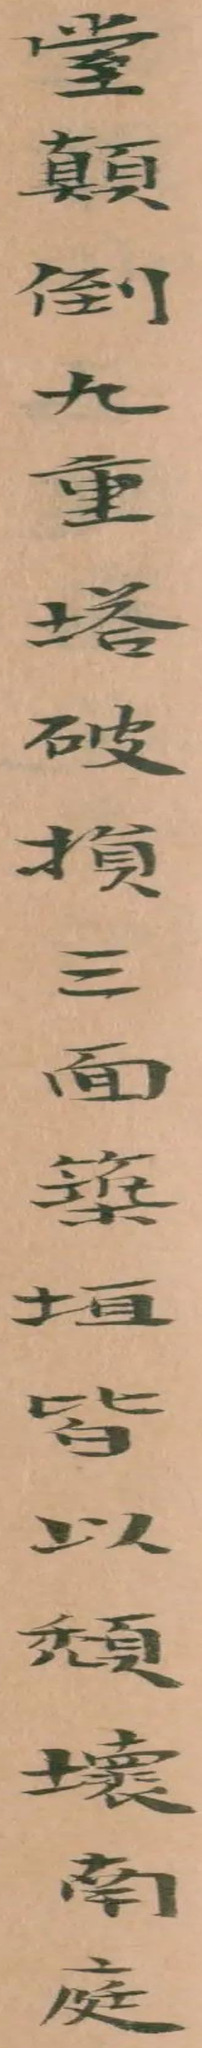堂顛倒九重塔破損三面築垣皆以頽壊南庭
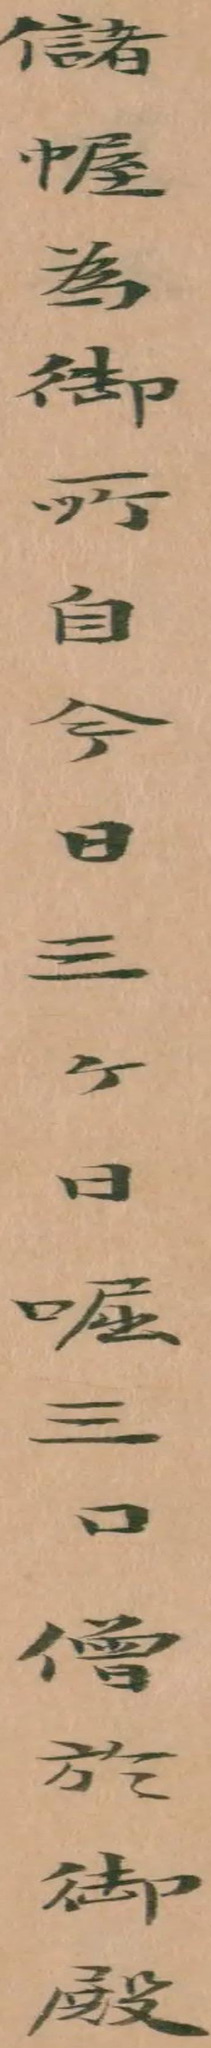儲幄為御所自今日三ヶ日啒三口僧於御殿
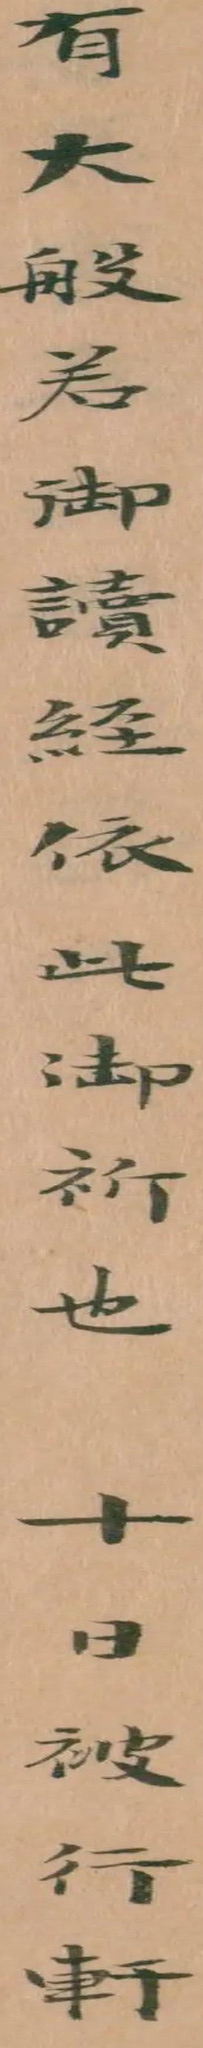有大般若御読経依此御祈也十日被行軒
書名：地災撮要. 巻5-6(地震之部)
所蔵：国立国会図書館 National Diet Library, JAPAN
